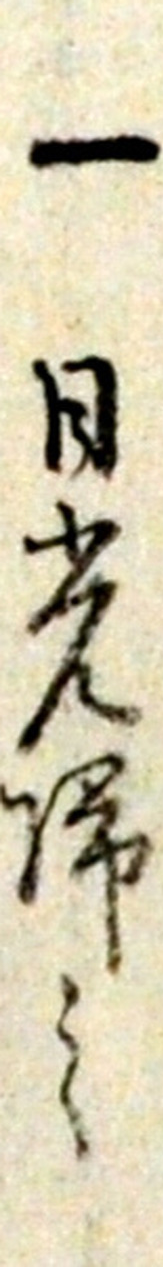一日光帰之
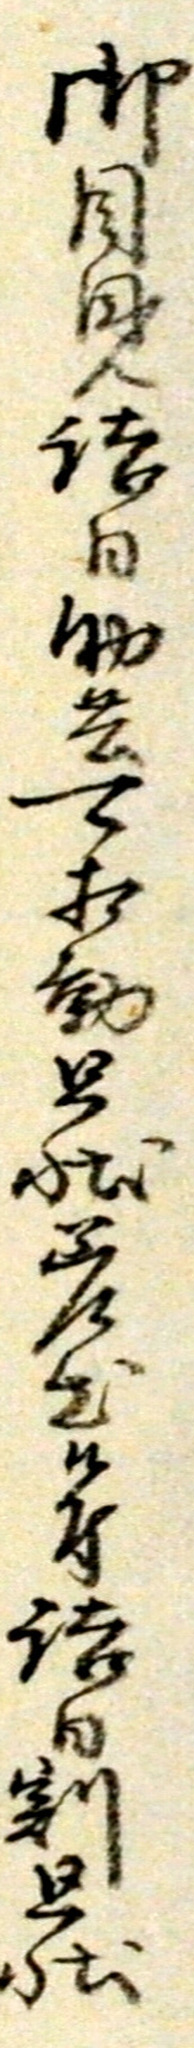御目見詰日助共可相勤廻状差出候付詰日割廻状
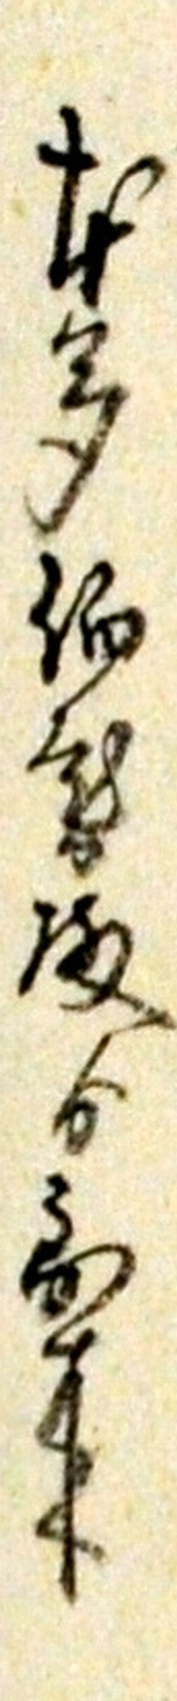本多伯耆殿ゟ到来

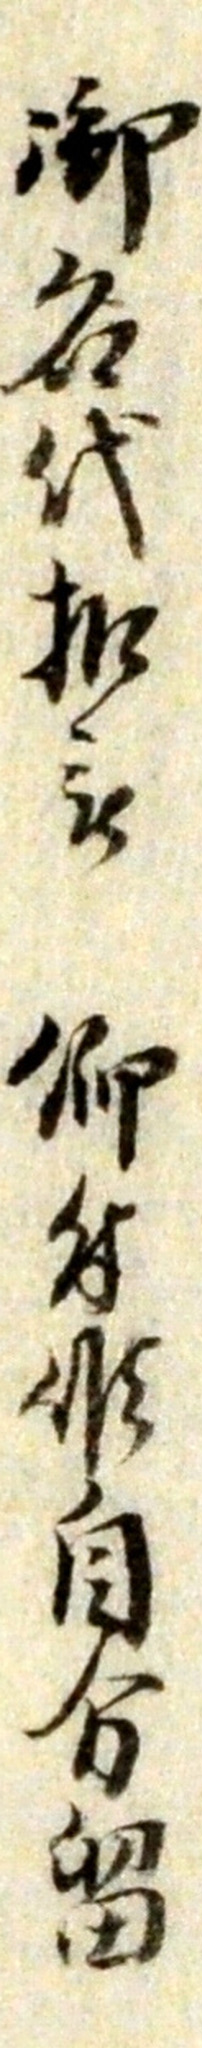御名代扣被仰付候自分留
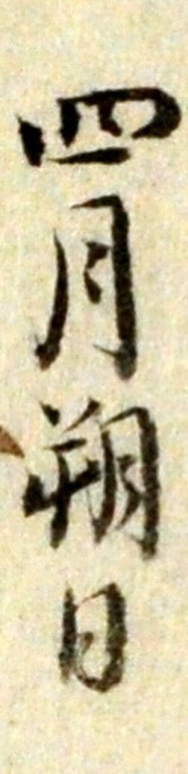四月朔日
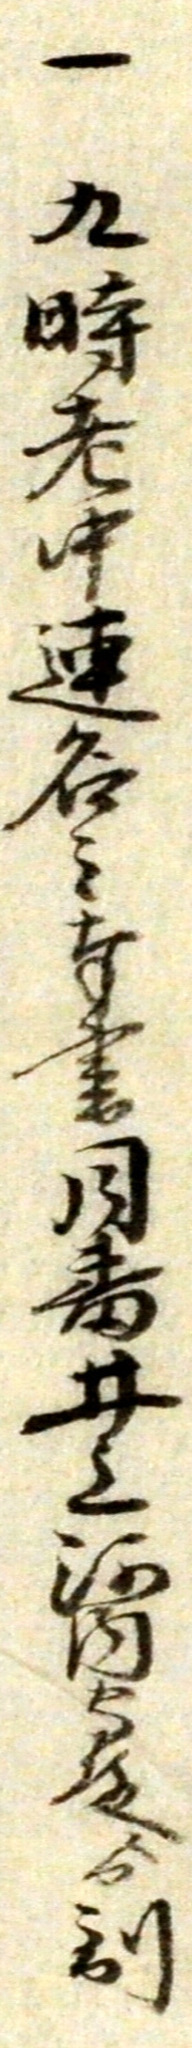一九時老中連名之奉書月番井上河内守殿ゟ到
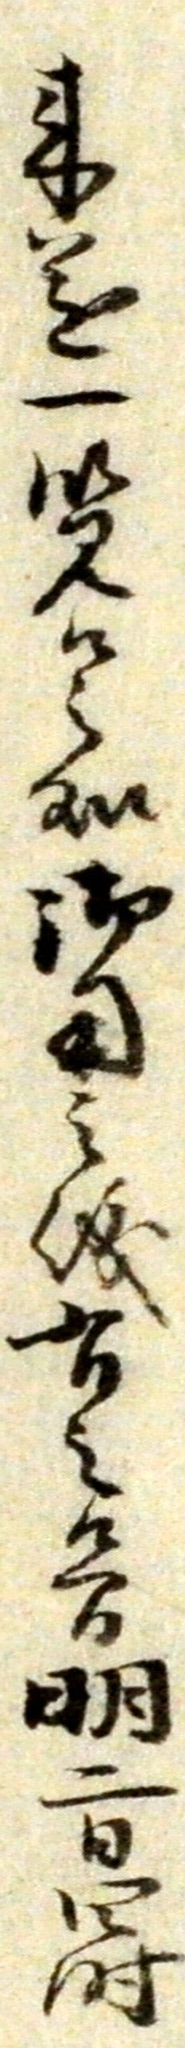来遂一覧候之処御用之儀有之候間明二日四時
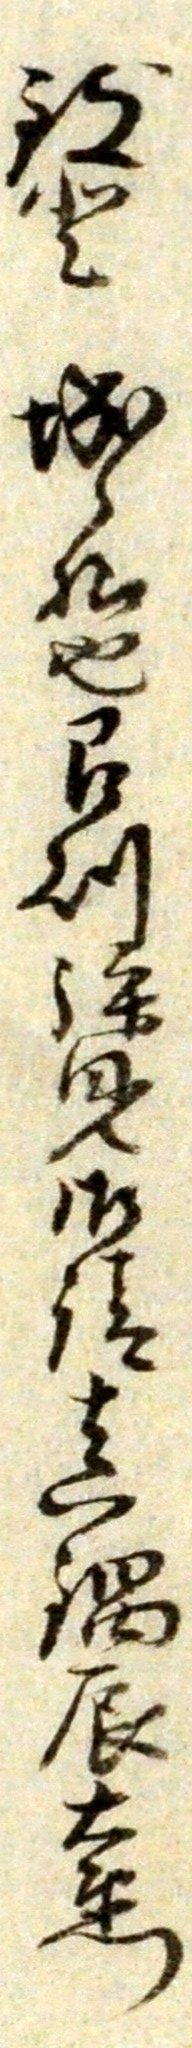致登城候様也即刻拝見御請真鍋辰右衛門
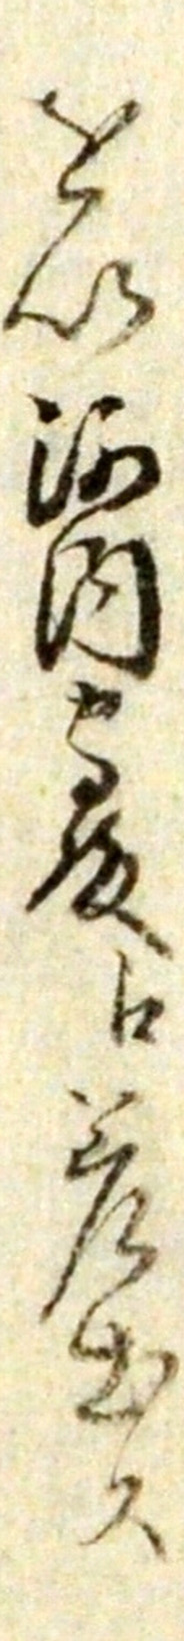を以河内守殿江差出ス
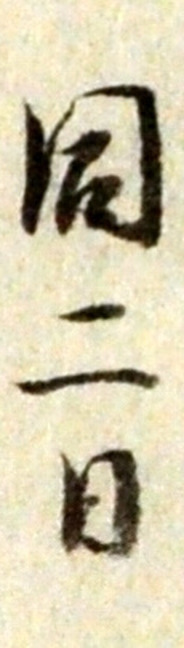同二日
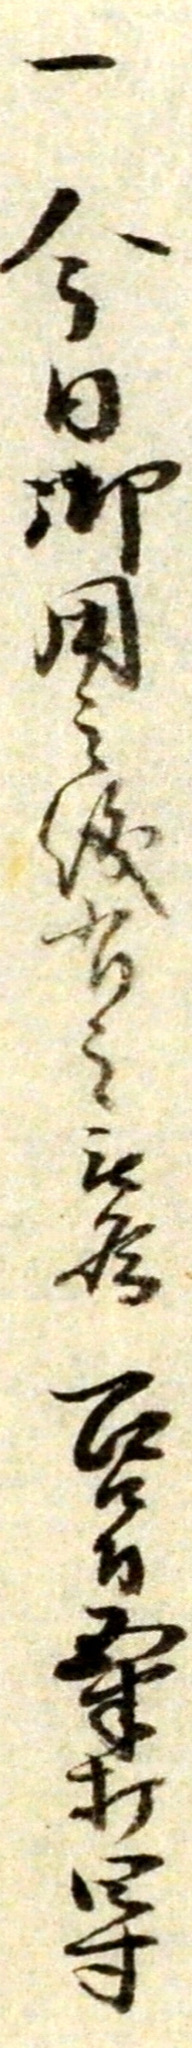一今日御用之儀有之被為召候付五半打四寸
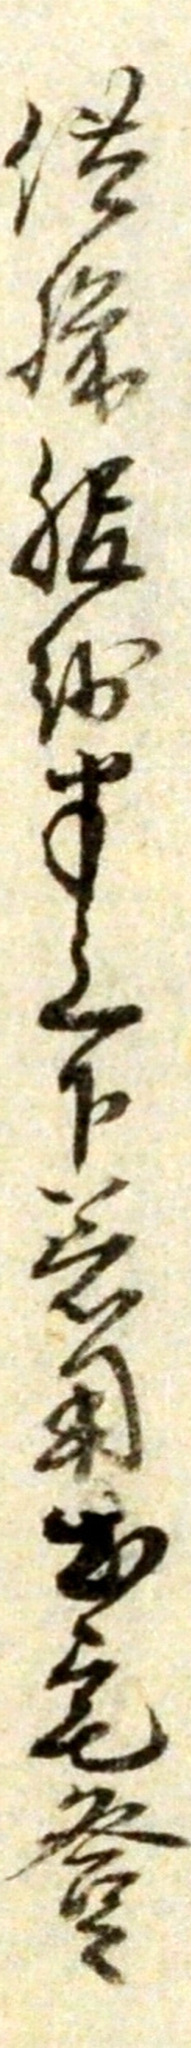供揃服紗半上下着用出宅登
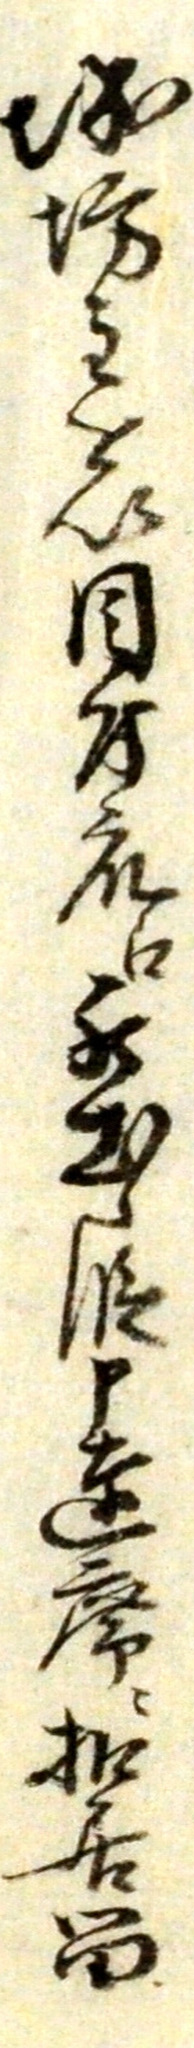城坊主を以目付衆江罷出候段申達席扣居留

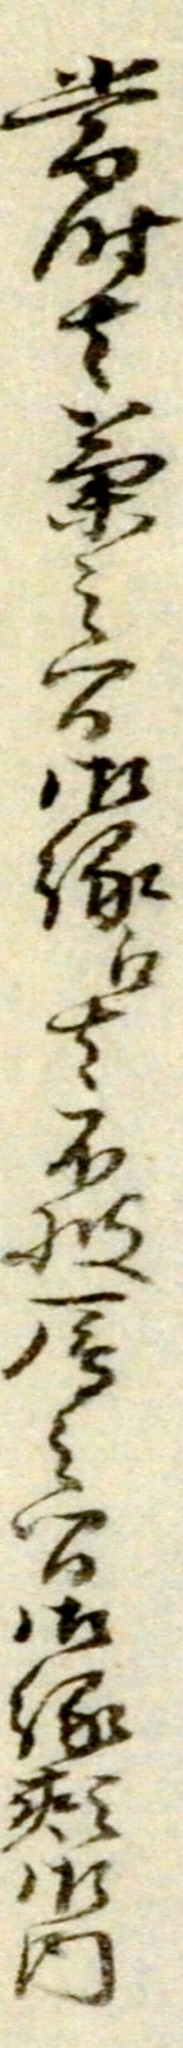当時者菊之間御縁江者不快雁之間御縁頬御内
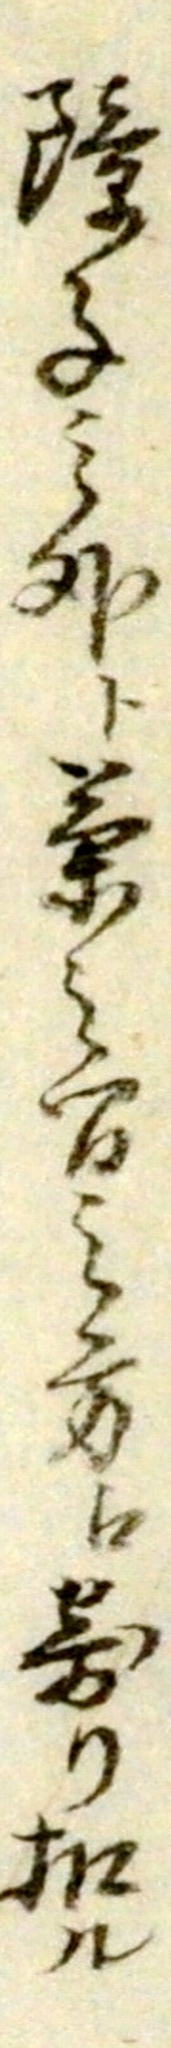障子之外ト菊之間之方江扣寄リ扣ル

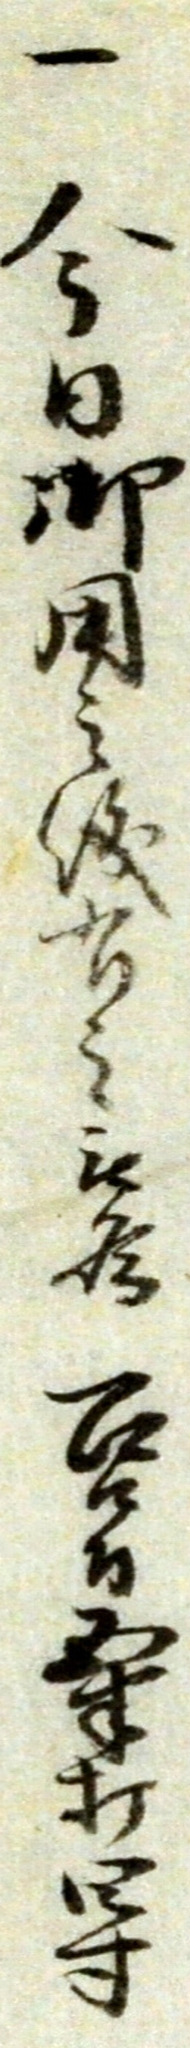一今日御用之儀有之被為召候付五半時四寸
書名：日光御名代相勤候節ノ留
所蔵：伊那市立高遠町図書館・合同会社AMANE
